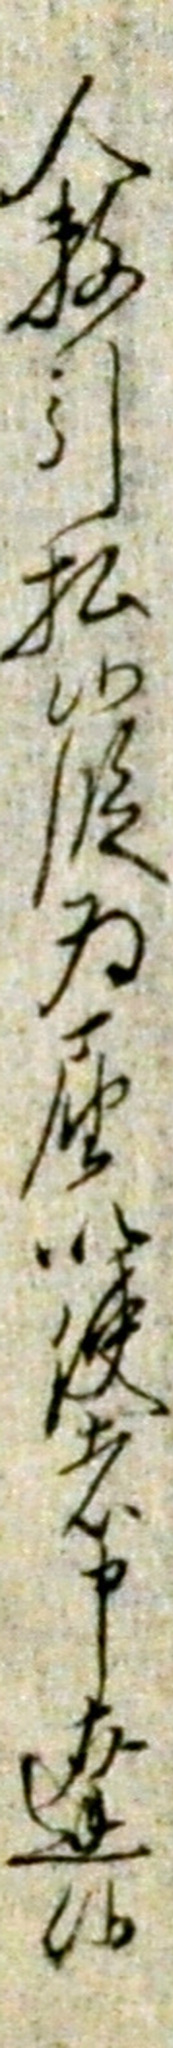人数引払候段為届以使者申達候
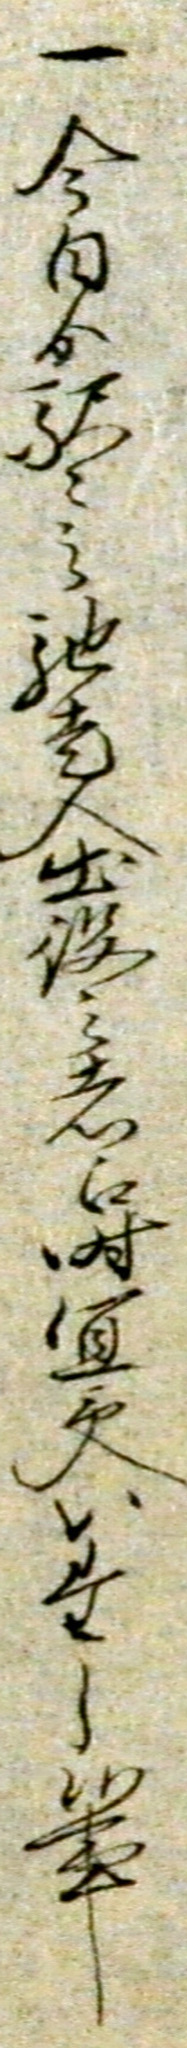一今日ゟ駅々之馳走人出役之者江時宜受い堂し候事
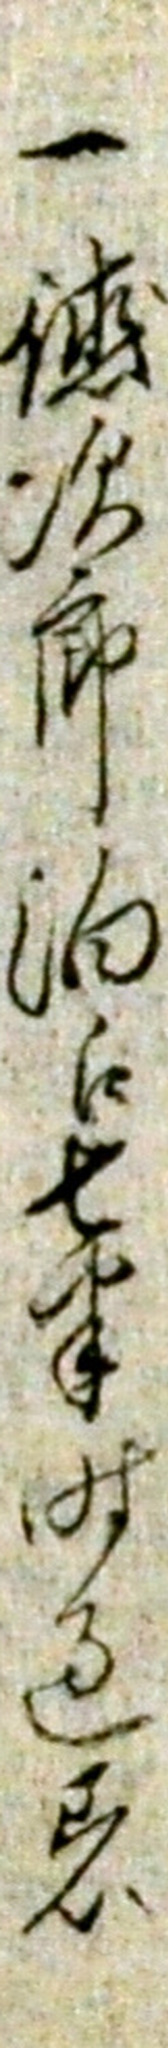一鉄次郎泊江七半時過着
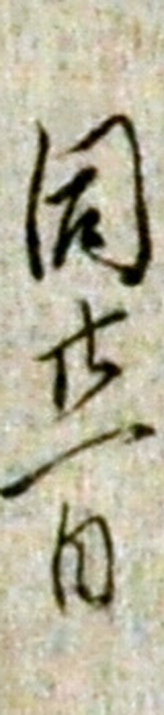同廿一日
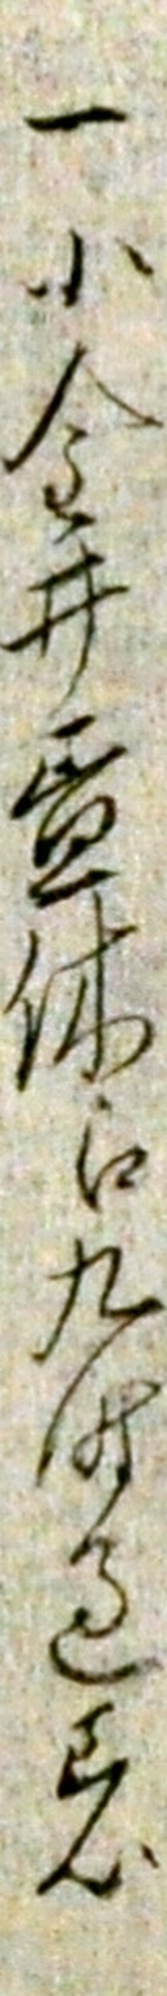一小金井昼休江九時過着
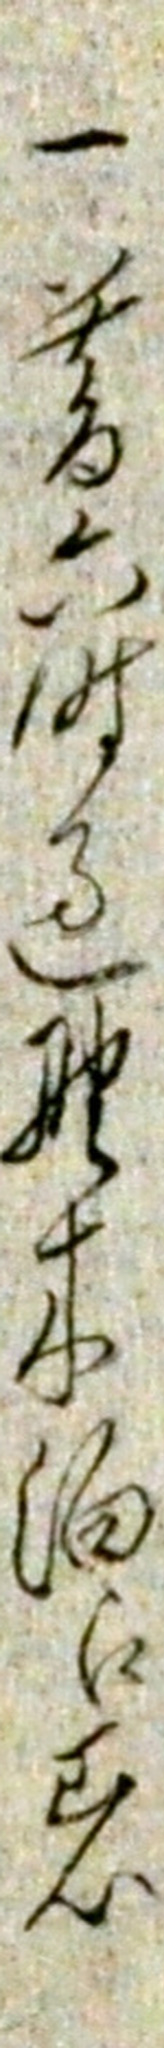一暮六時過野木泊江着
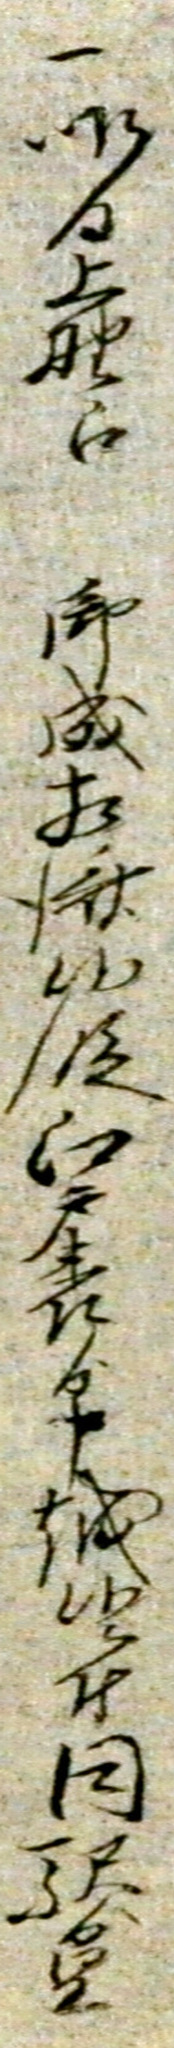一昨日上野江御成相済候段江戸表ゟ申越候二付同駅ゟ口上
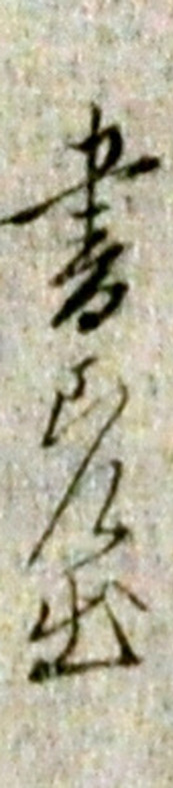所差出
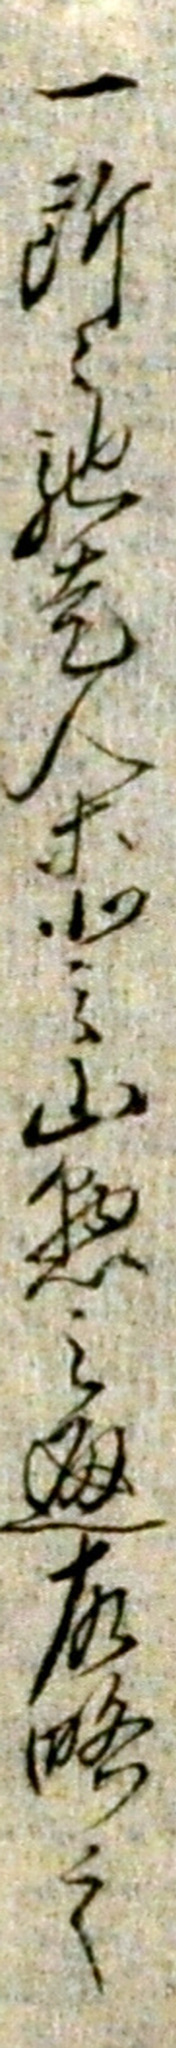一所々馳走人抔登山懸通故略之
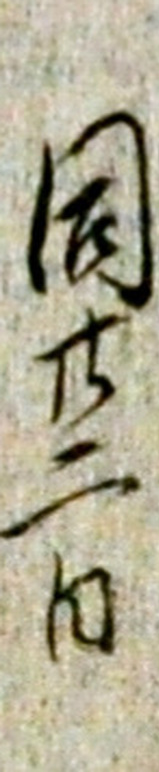同廿二日
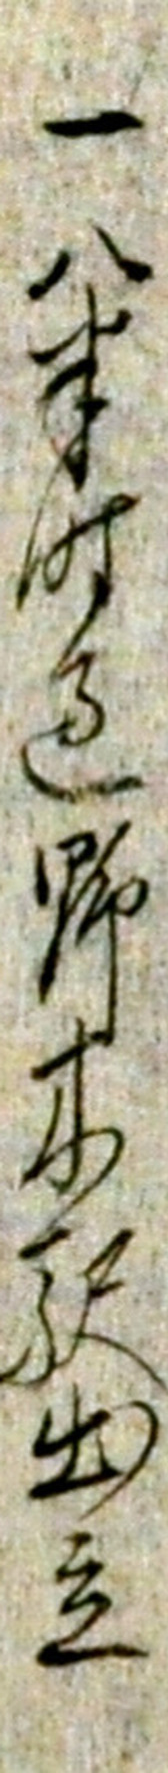一八半時過野木駅出立
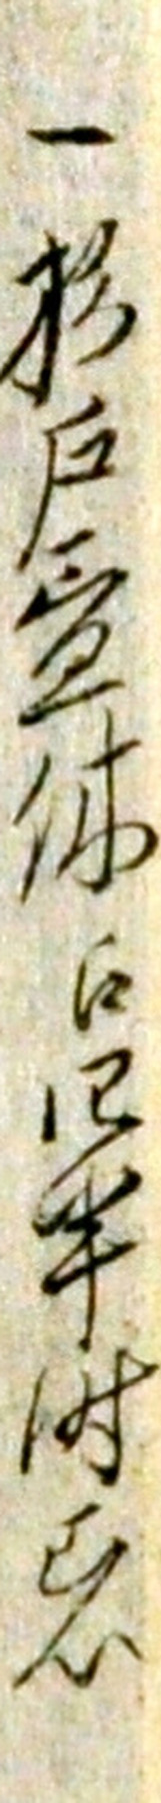一杉戸昼休江四半時着
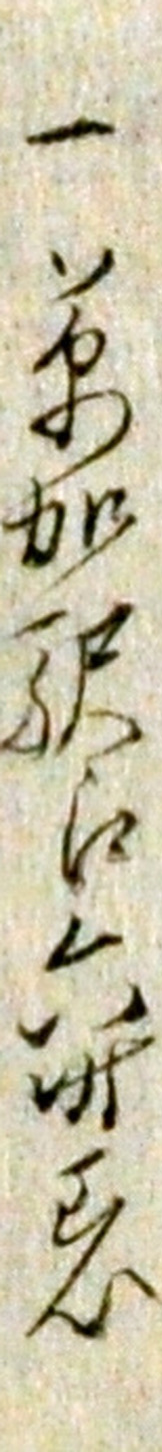一草加駅江六時着
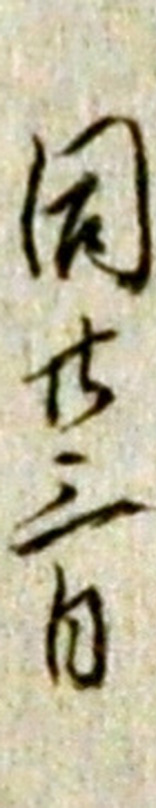同廿三日
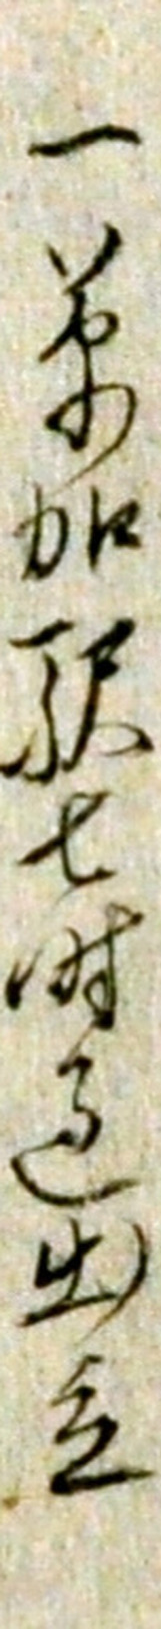一草加駅七時過出立
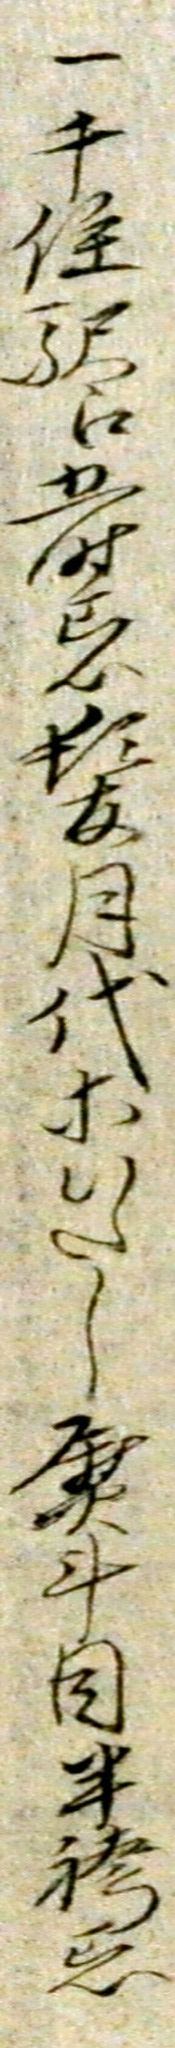一千住駅江五時着髪月代抔いたし熨斗目半袴着
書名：日光御名代相勤候節ノ留
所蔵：伊那市立高遠町図書館・合同会社AMANE
